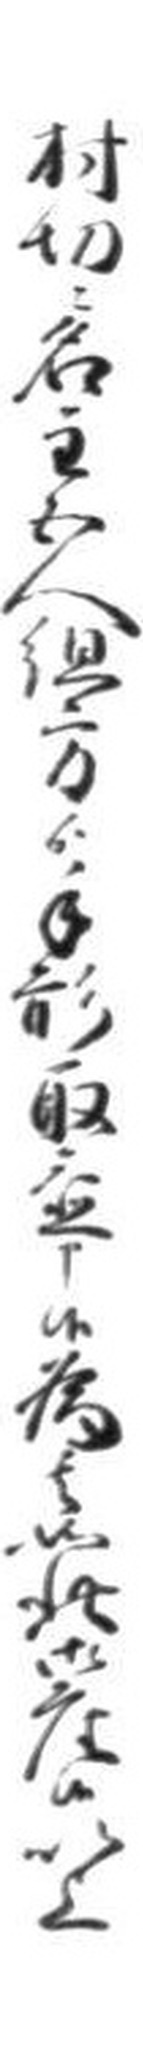村切ニ名主五人組ゟ手形取置申候為其如此御座候以上
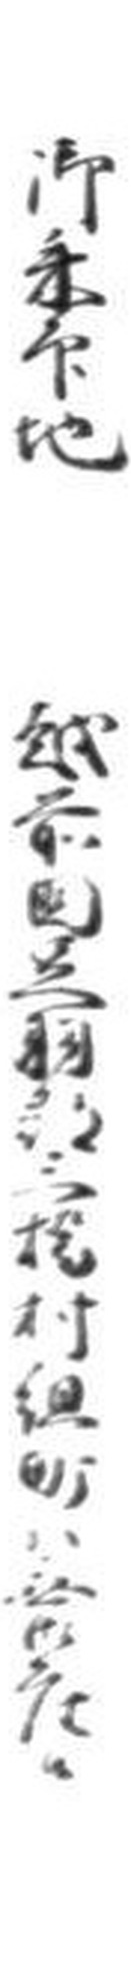御朱印地越前国足羽郡三橋村組町ハ無御座候
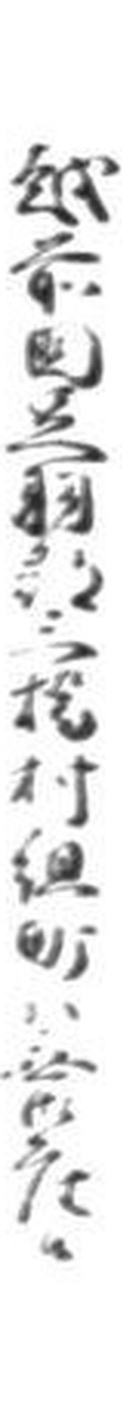御朱印地越前国足羽郡三橋村組町ハ無御座候
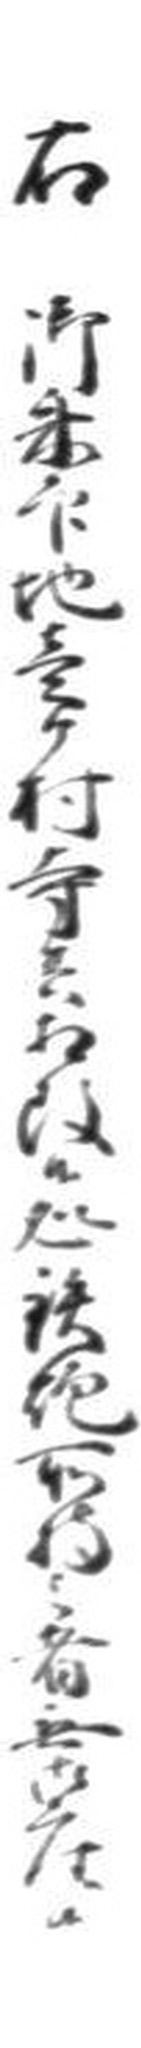右御朱印地壱ヶ村寺共相改候処鉄炮所持之者無御座候
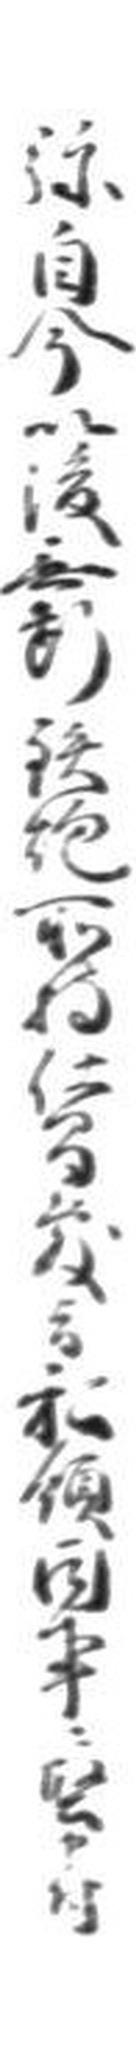弥自今以後無断鉄炮所持仕間敷旨私領同事ニ堅申付
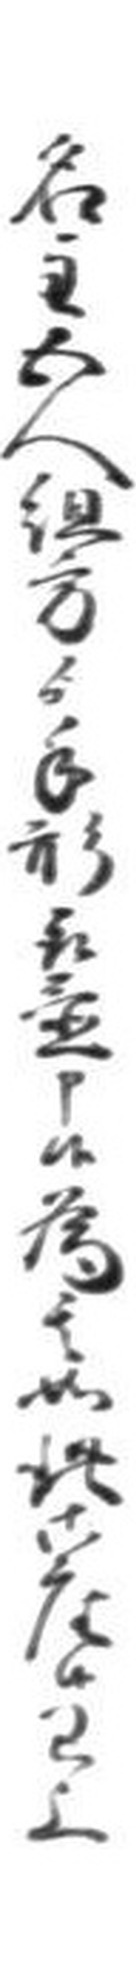名主五人組方ゟ手形取置申候為其如此御座候已上
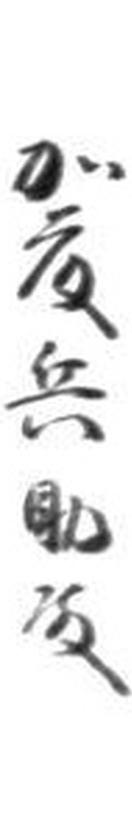加藤兵助殿
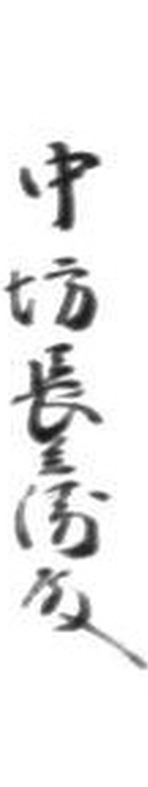中坊長兵衛殿

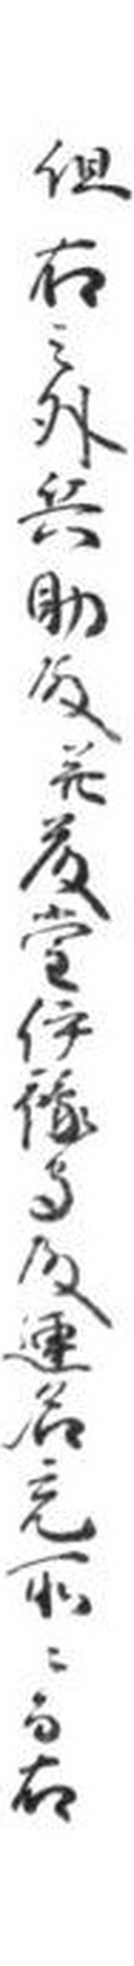但右之外兵助殿并藤堂伊予守殿連名充所ニ而右
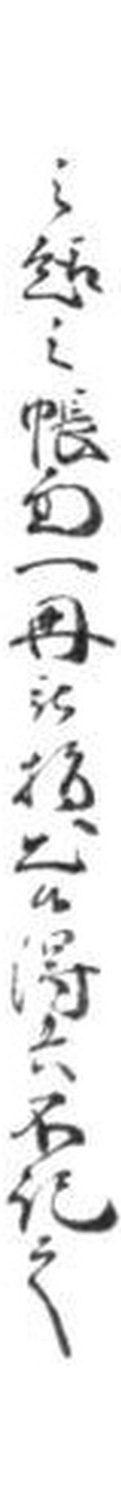之趣之帳面一冊被指出候得共不記之
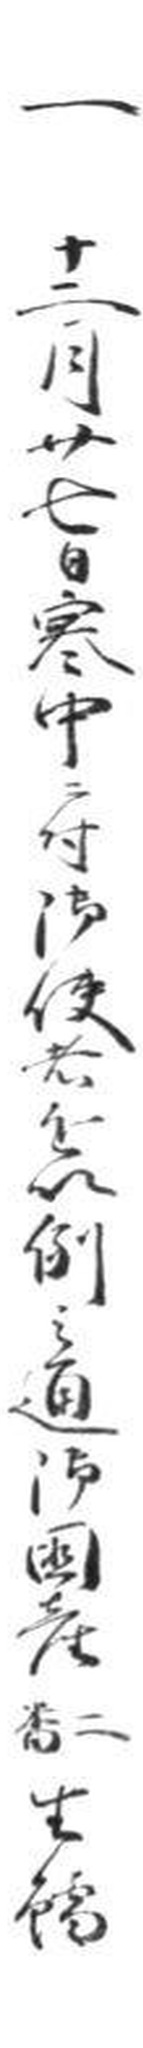一十二月廿七日寒中ニ付御使者を以例之通御国産二番生鱈
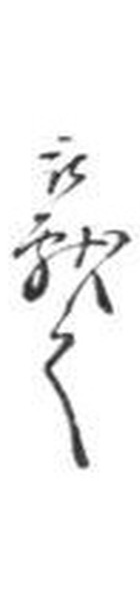被献之
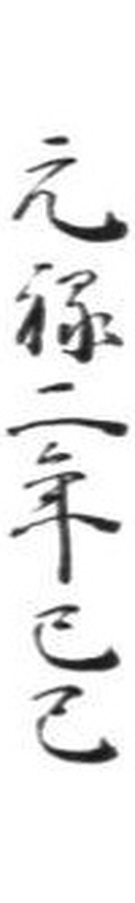元禄二年己巳
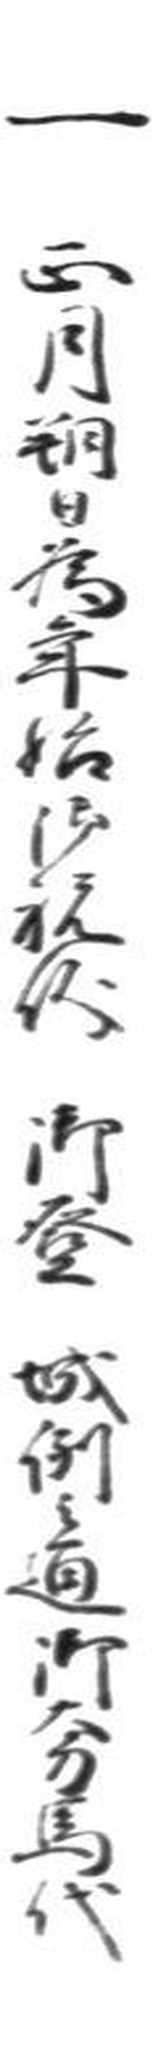一正月朔日為年始御祝儀御登城例之通御太刀馬代
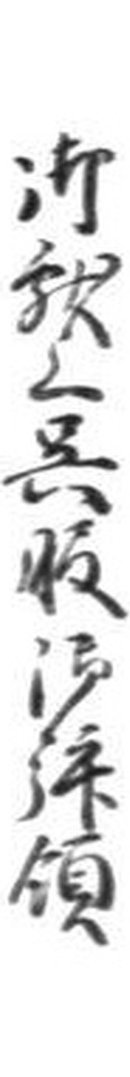御献上呉服御拝領
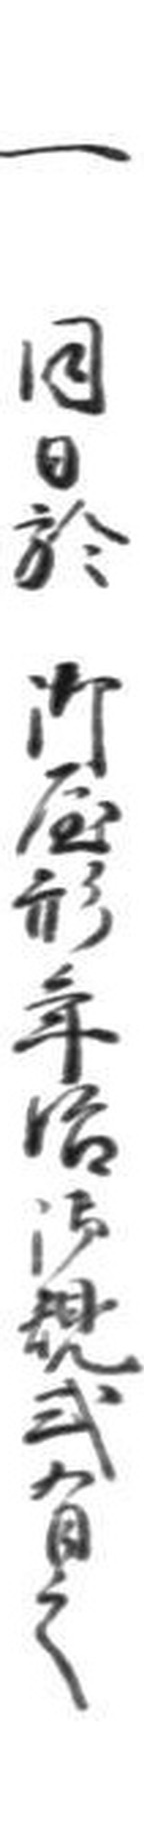一同日於御屋形年始御規式有之
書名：家譜 十七 吉品公 従元禄元年到同二年
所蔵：福井県文書館 Fukui Prefectural Archives
